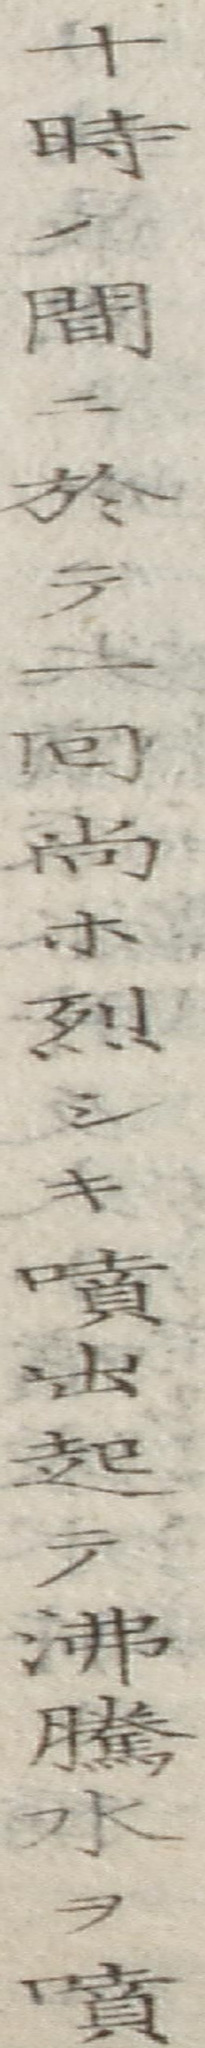十時ノ間ニ於テ一回尚ホ烈シキ噴出起テ沸騰水ヲ噴
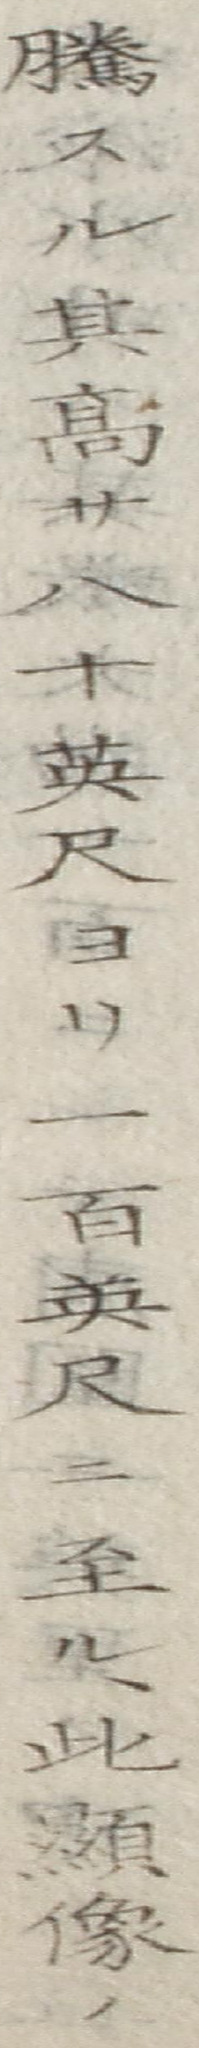騰スル其高サ八十英尺ヨリ一百英尺ニ至ル、此顕像ノ
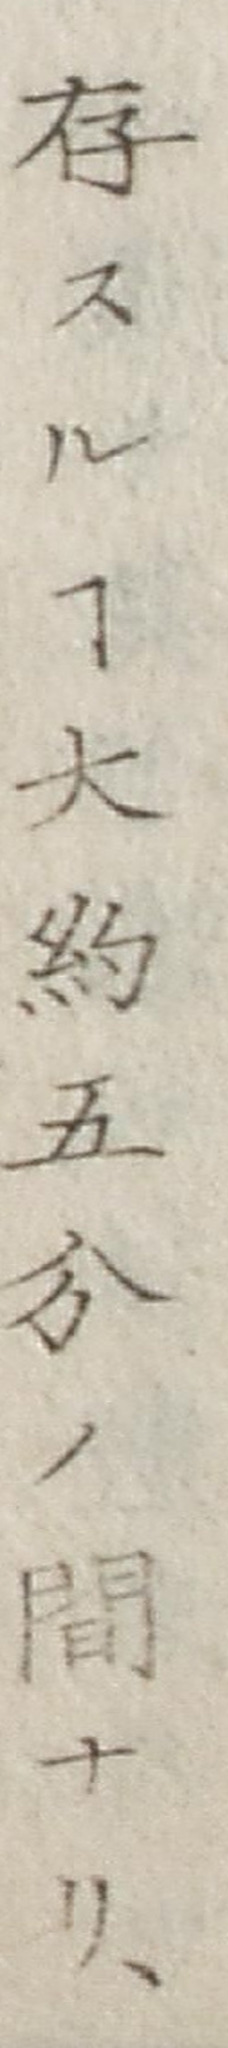存スルヿ大約五分ノ間ナリ、
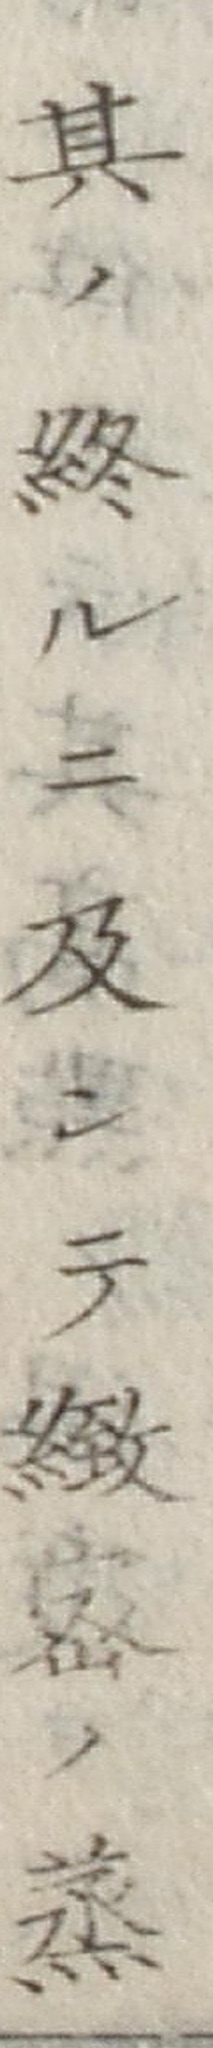其ノ終ルニ及ンテ緻密ノ蒸
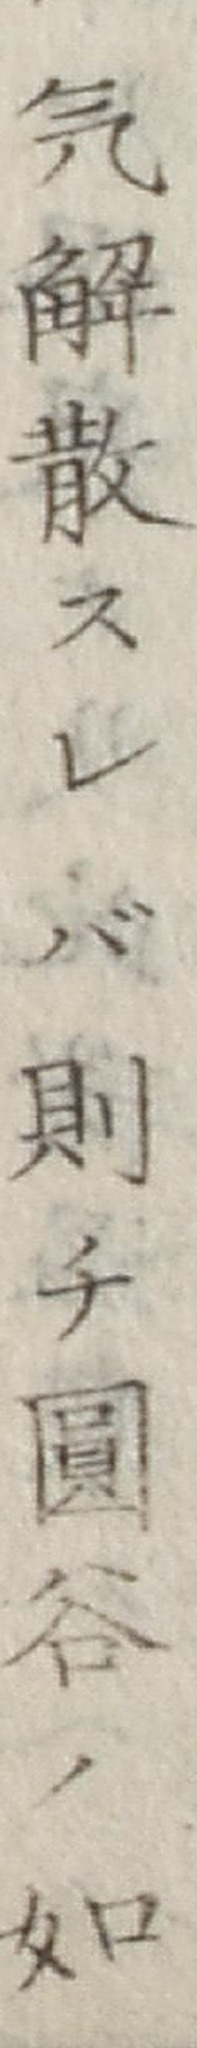気解散スレバ則テ円谷ノ如
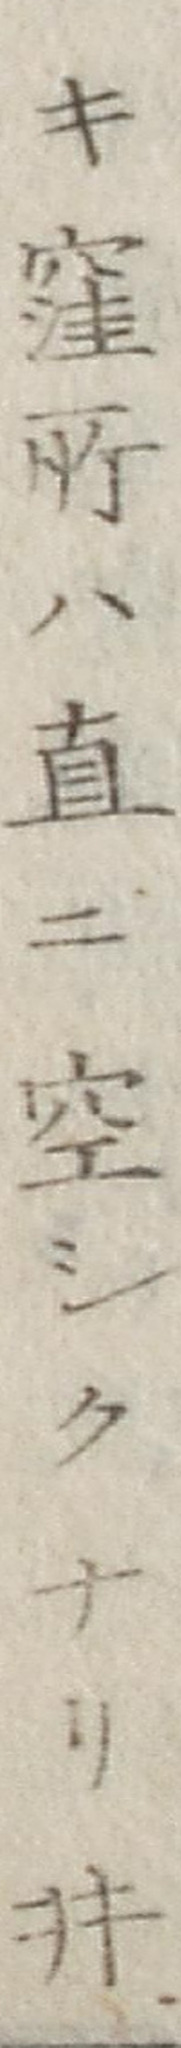キ窪所ハ直ニ空シクナリ井
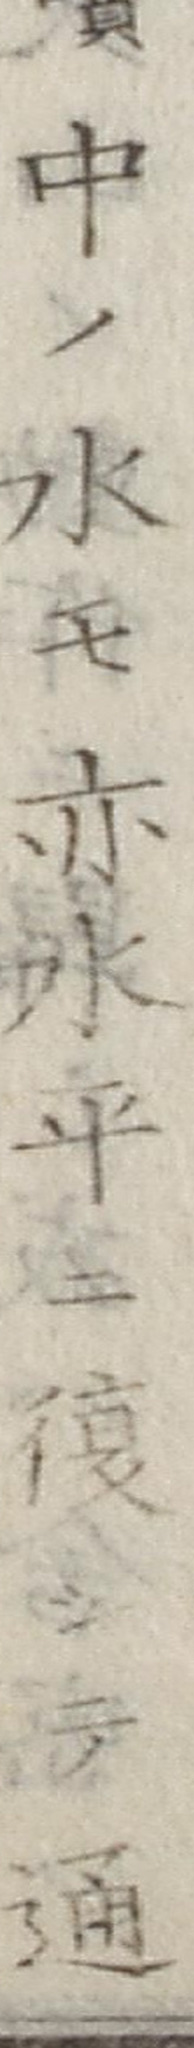中ノ水モ亦水平ニ復シテ通
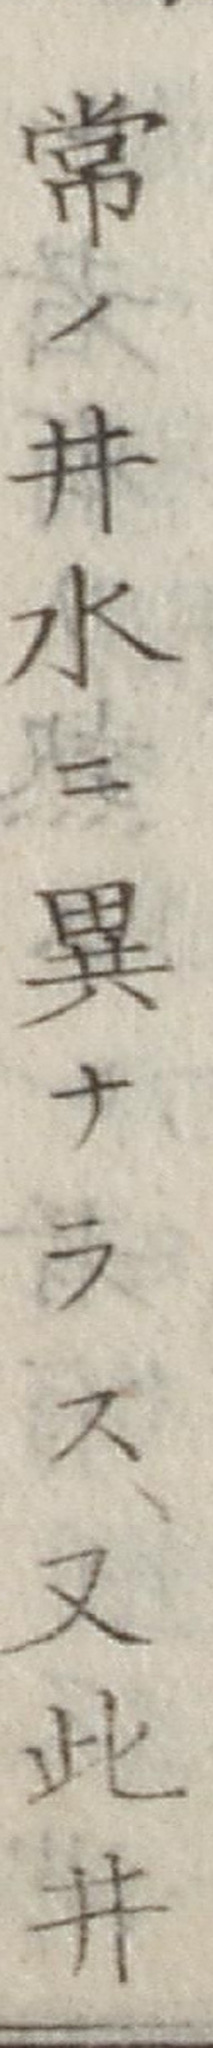常ノ井水ニ異ナラス、又此井
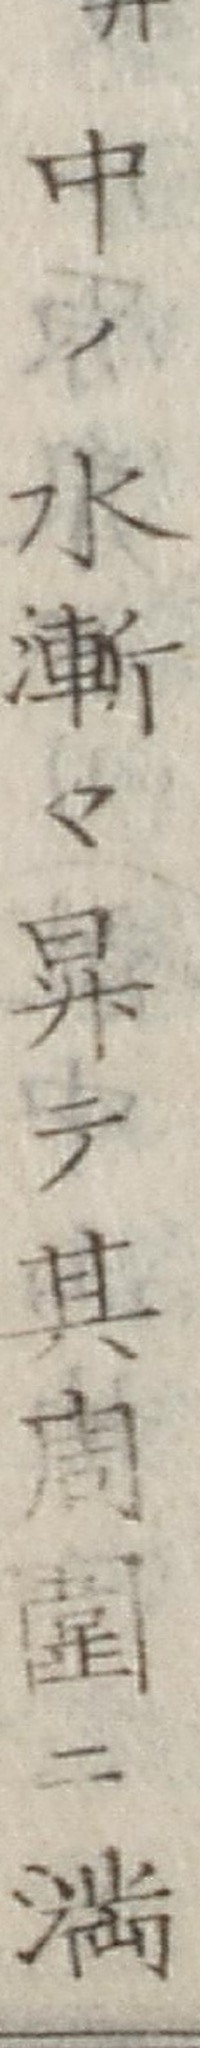中ノ水漸々昇テ其周囲ニ満
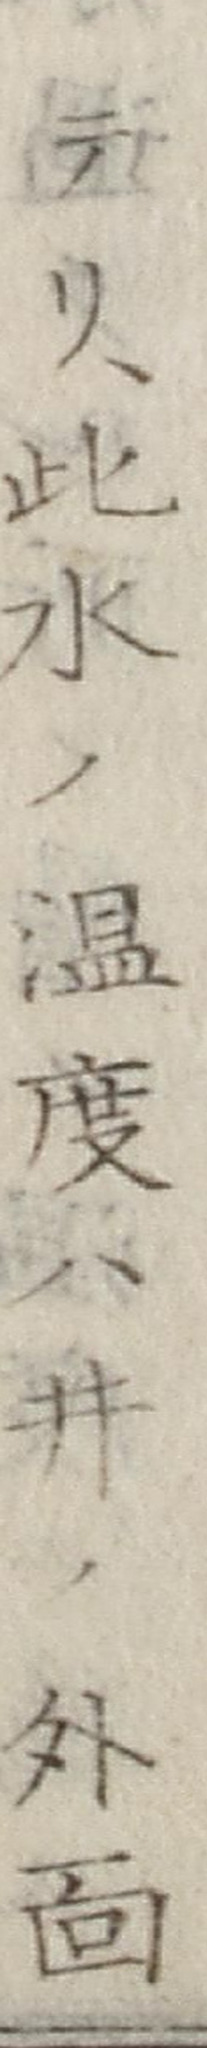テリ、此水ノ温度ハ井ノ外面
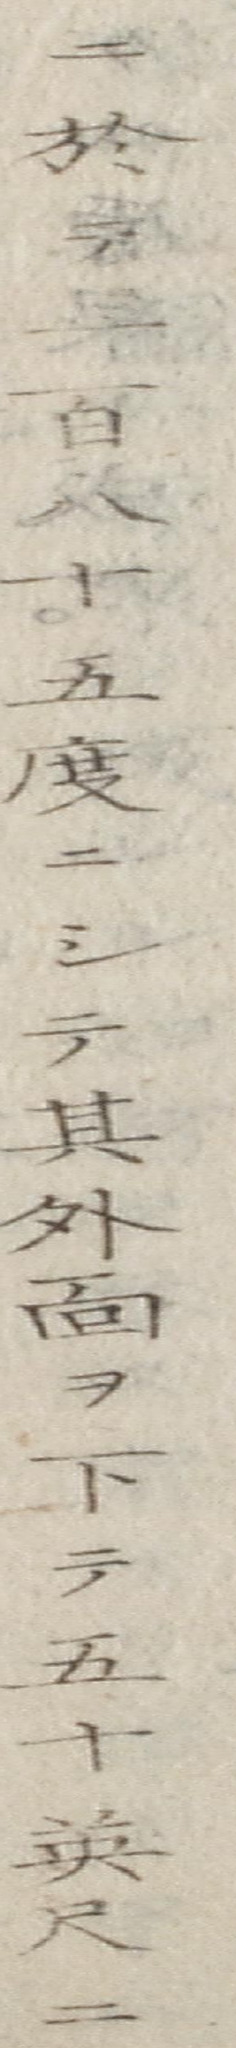ニ於テ一百八十五度ニシテ其外面ヲ下テ五十英尺ニ
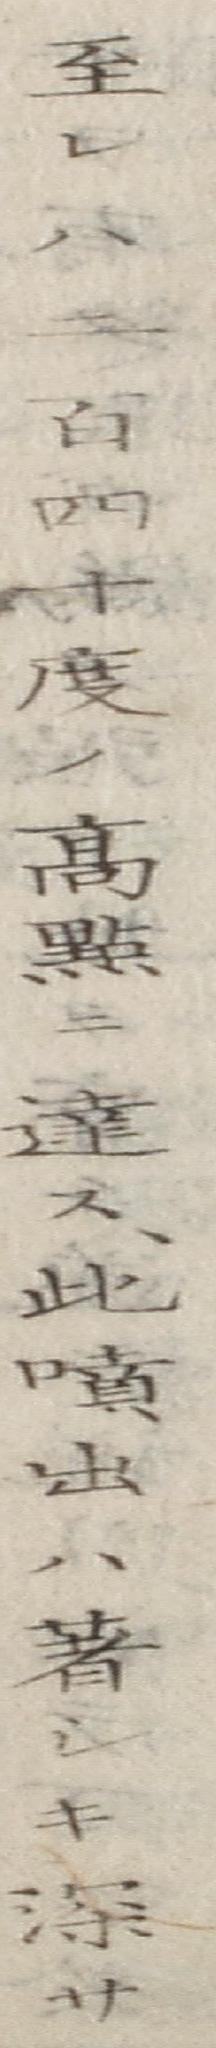至レハ二百四十度の高点ニ達ス、此噴出ハ著シキ深サ
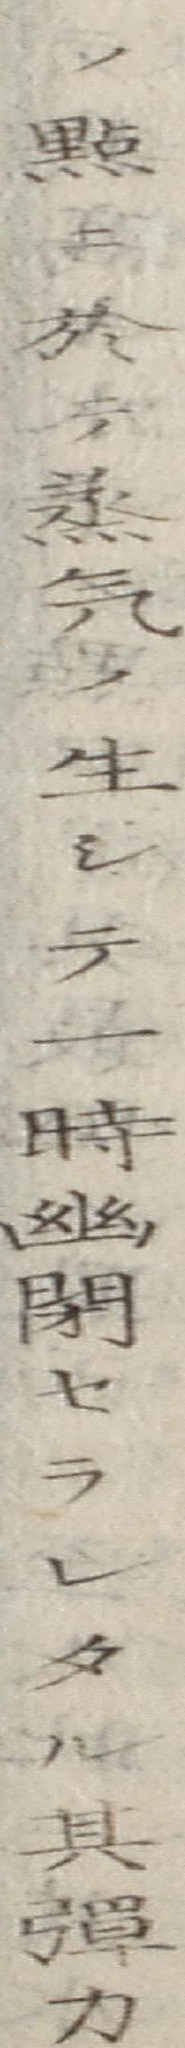ノ点ニ於テ蒸気ノ生シテ一時幽閉セラレタル其弾力
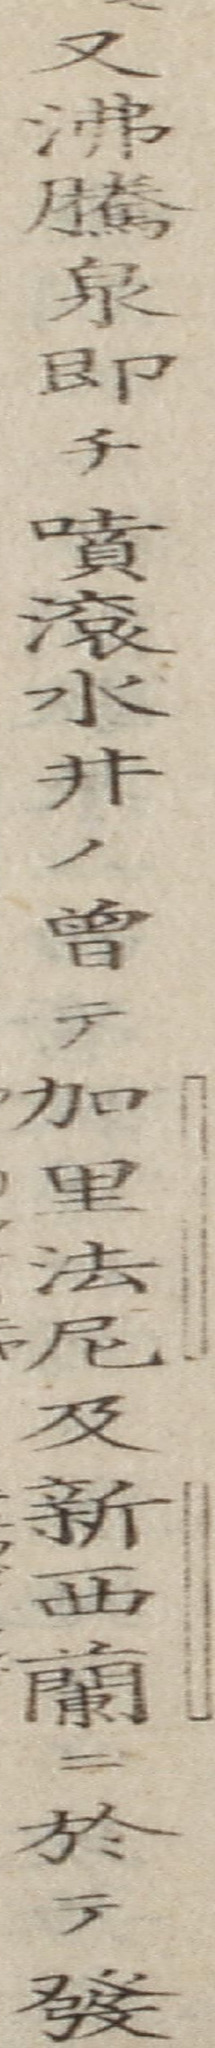七又沸騰泉即チ噴滾水井ノ曾テ加里法尼及新西蘭ニ於テ発
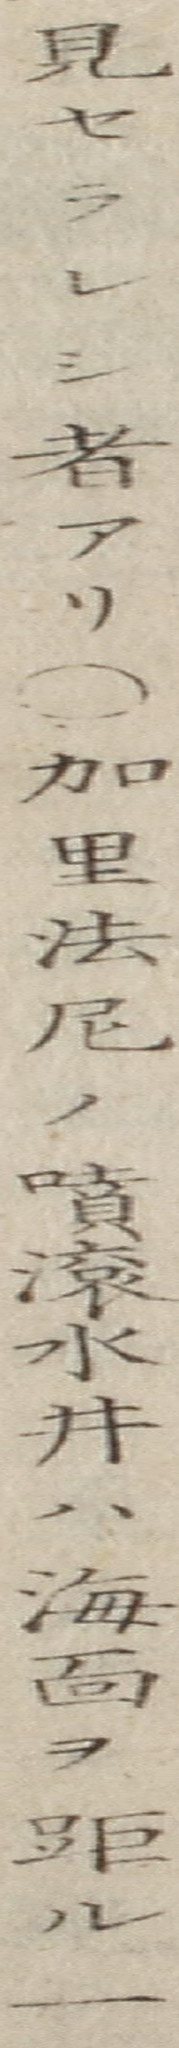見セラレシ者アリ○加里法尼ノ噴滾水井ハ海面ヲ距ル一
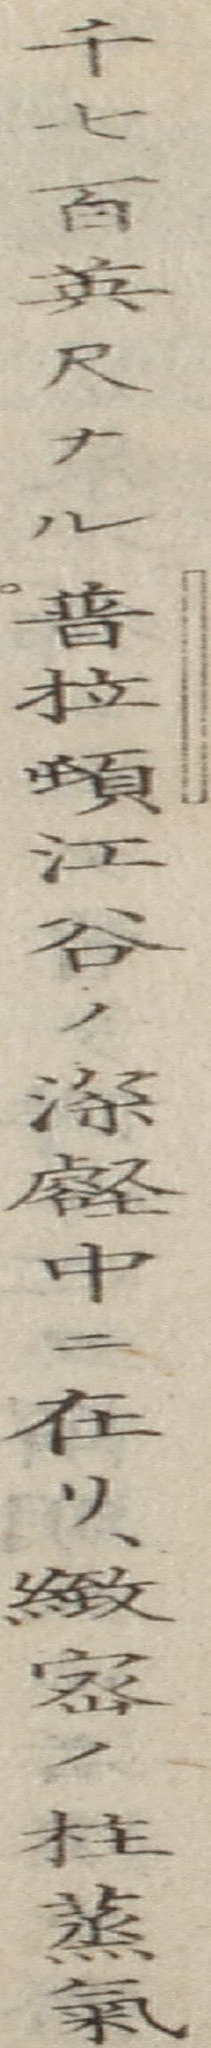千七百英尺ナル普拉頓江谷ノ深壑中ニ在リ、緻密ノ柱蒸気
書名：地形論　巻二
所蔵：東京大学地震研究所図書室 Earthquake Research Institute Library, The University of Tokyo, JAPAN
